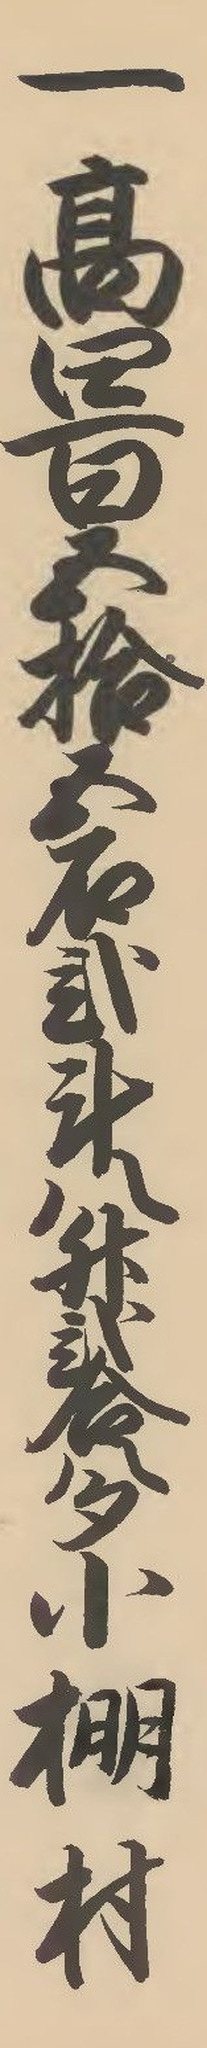一髙四百五拾五石弐斗八升弐合八夕小棚村
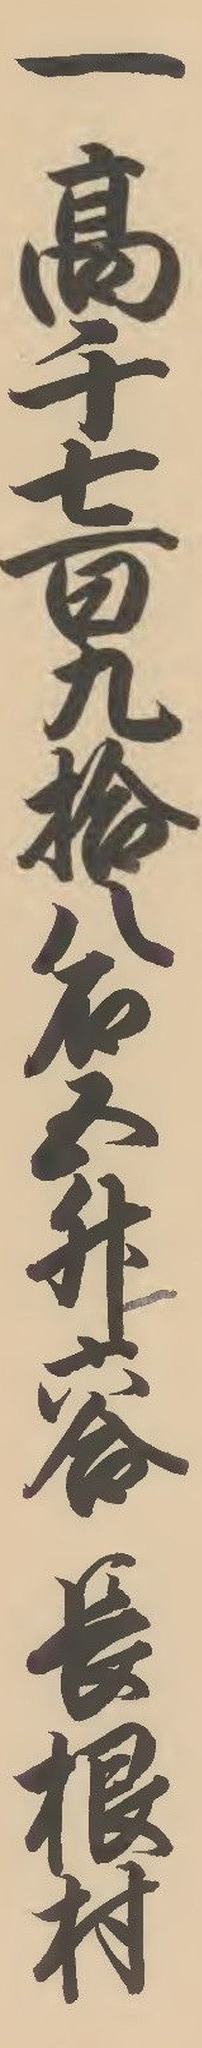一髙千七百九拾八石五升六合長根村

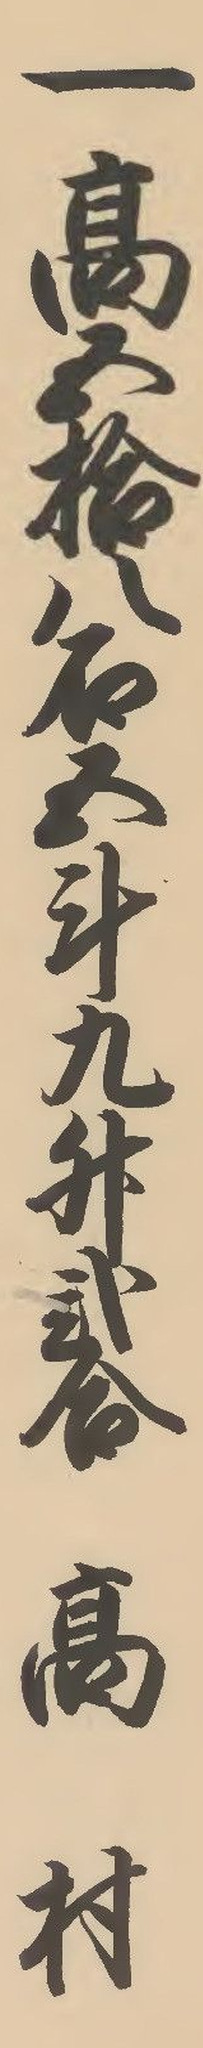一髙五拾八石五斗九升弐合髙村
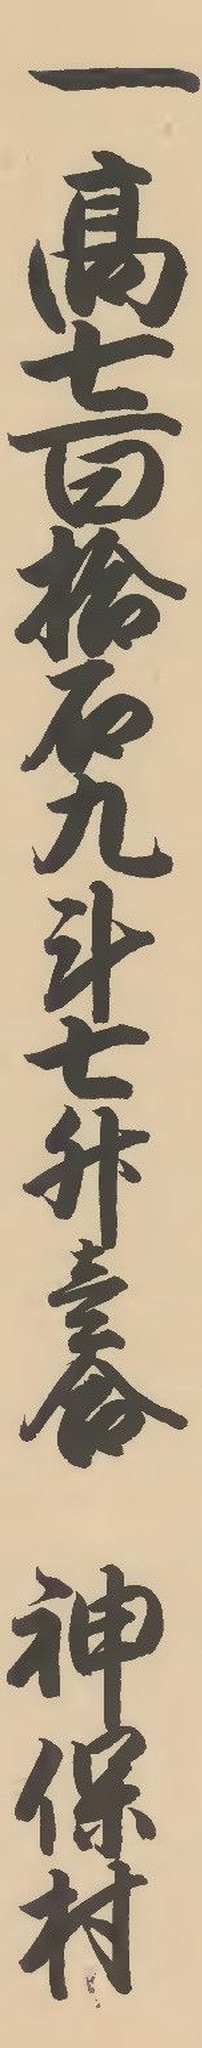一髙七百拾石九斗七升壱合神保村
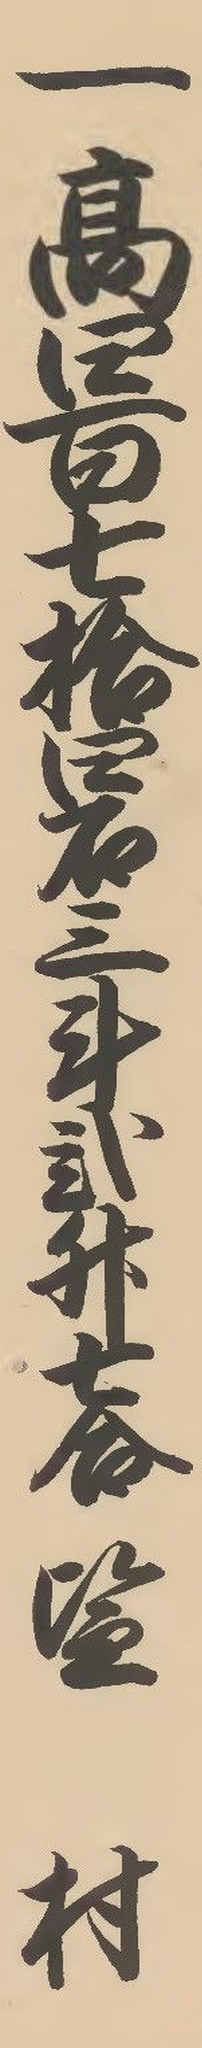一髙四百七拾四石三斗弐升七合塩村
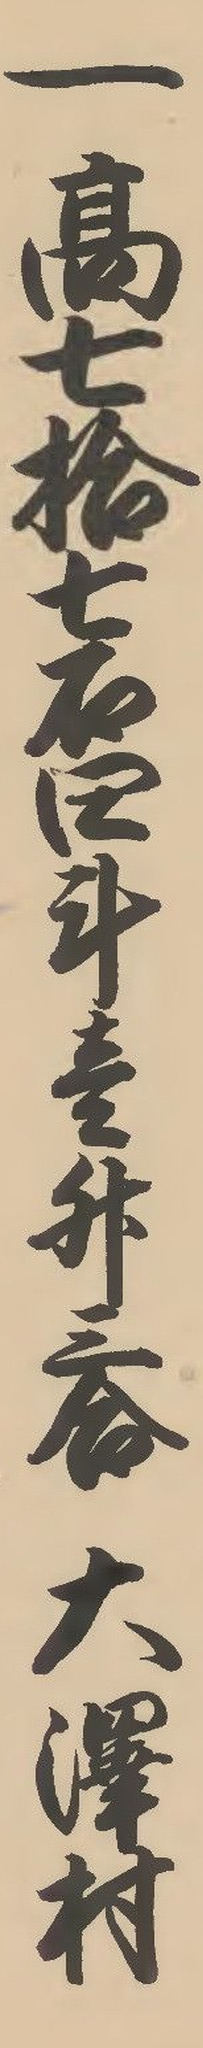一髙七拾七石四斗壱升三合大澤村
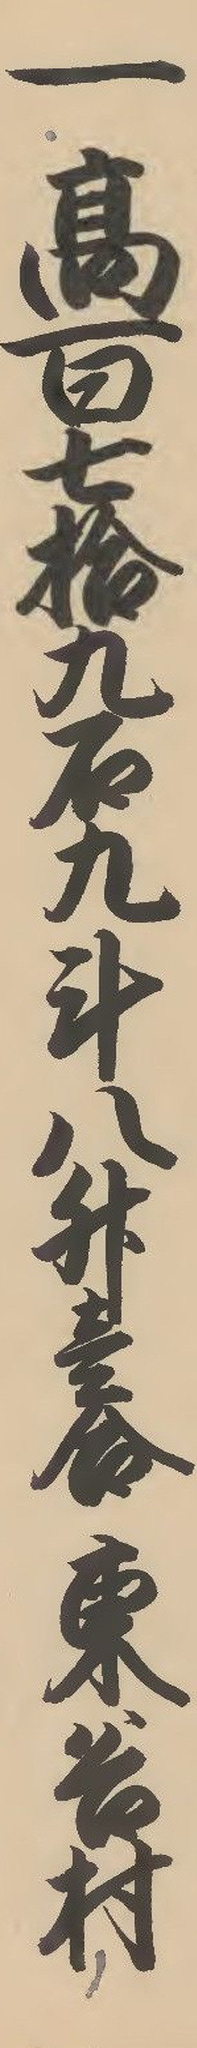一髙百七拾九石九斗八升壱合東谷村
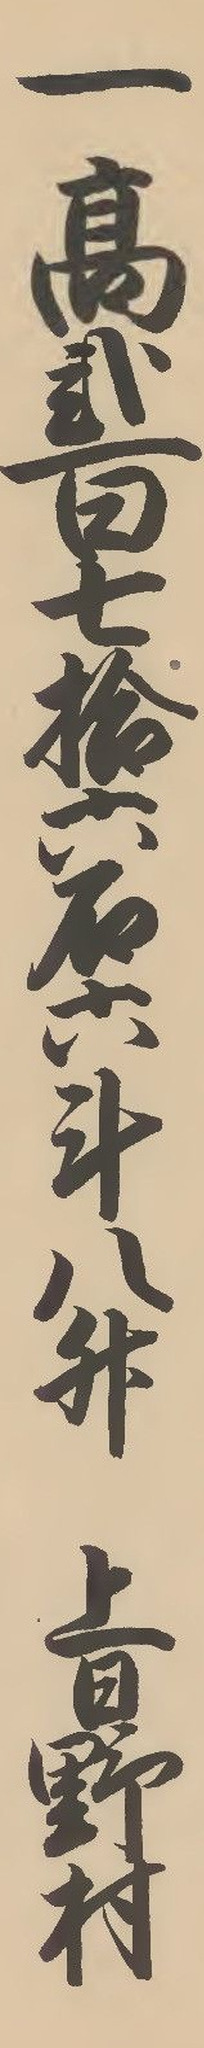一髙弐百七拾六石六斗八升上日野村
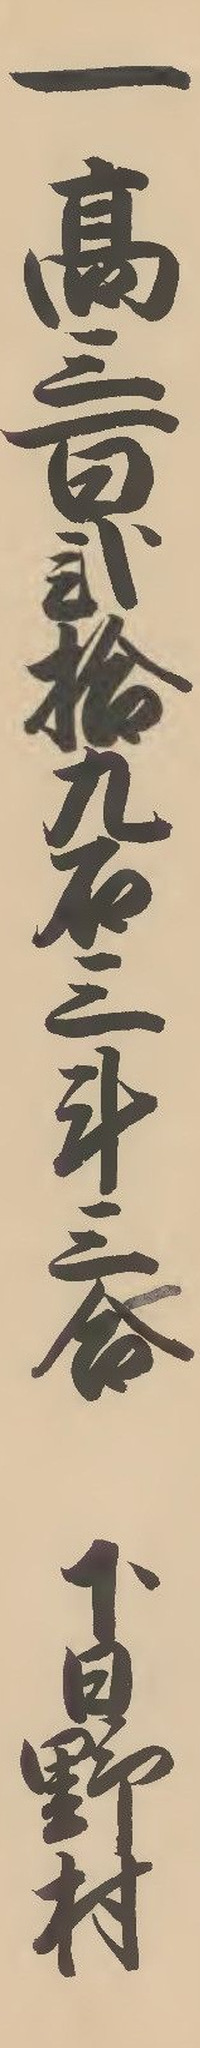一髙三百弐拾九石三斗三合下日野村

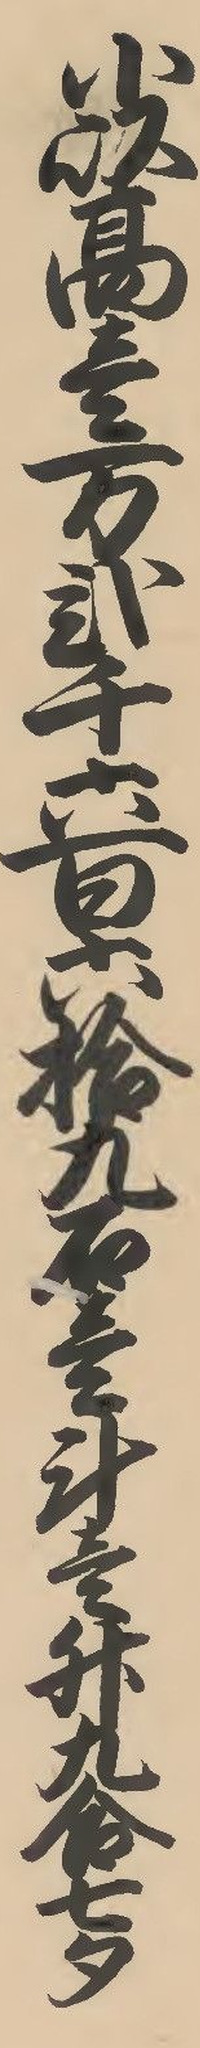小以髙壱万弐千六百六拾九石壱斗壱升九合七夕
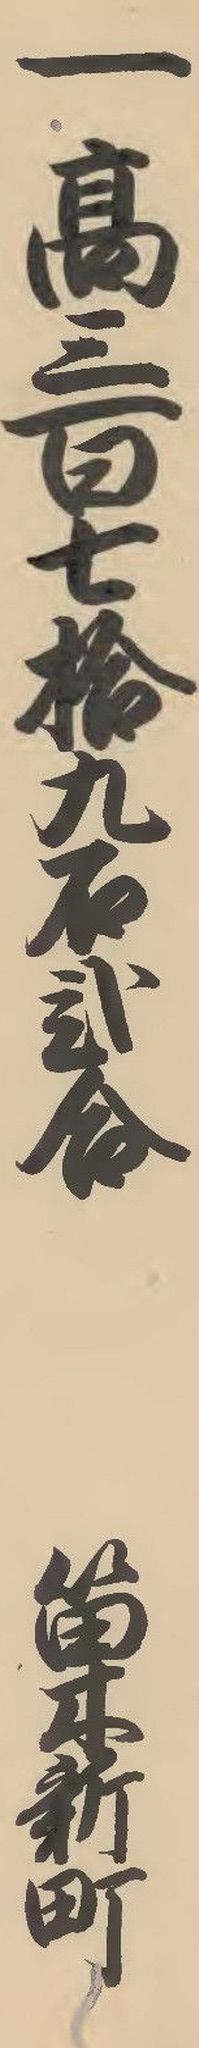一髙三百七拾九石弐合笛木新町
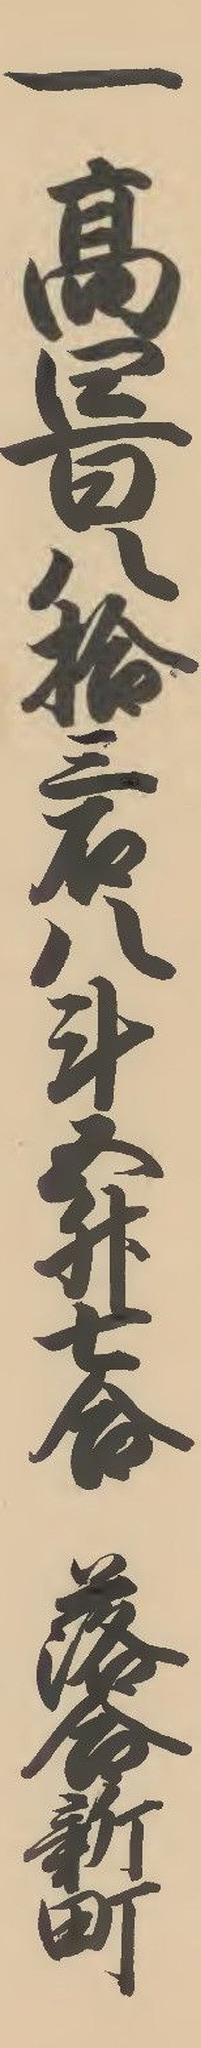一髙四百八拾三石八斗五升七合落合新町
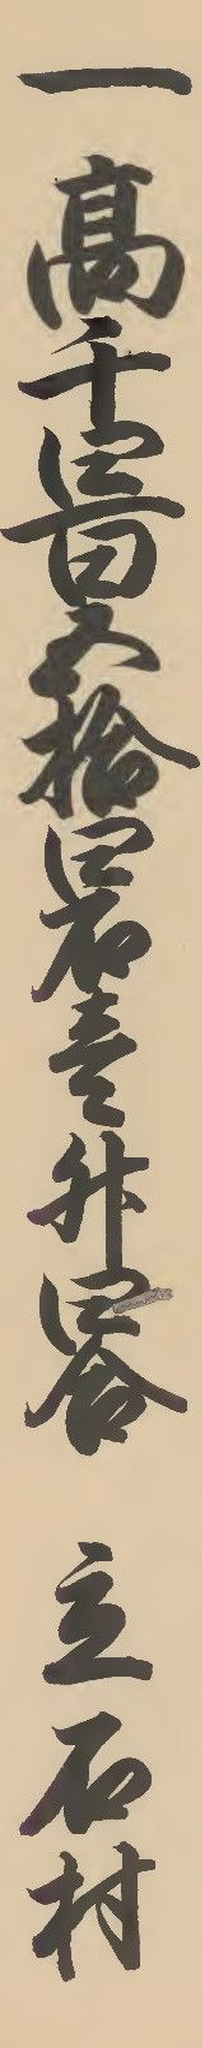一髙千四百五拾四石壱升四合立石村

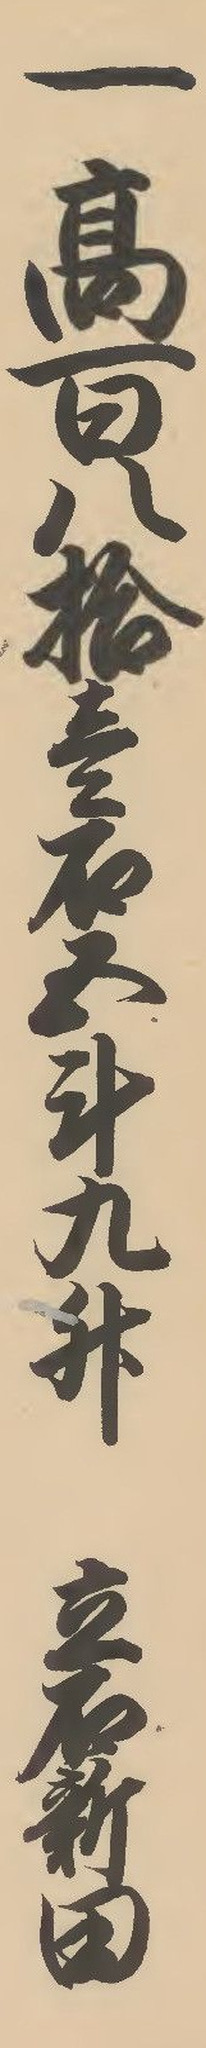一髙百八拾壱石五斗九升立石新田
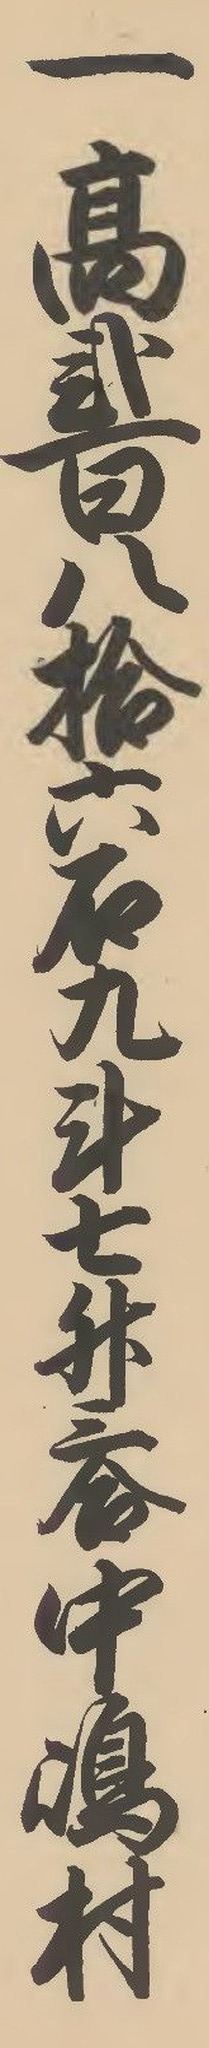一髙弐百八拾六石九斗七升三合中嶋村
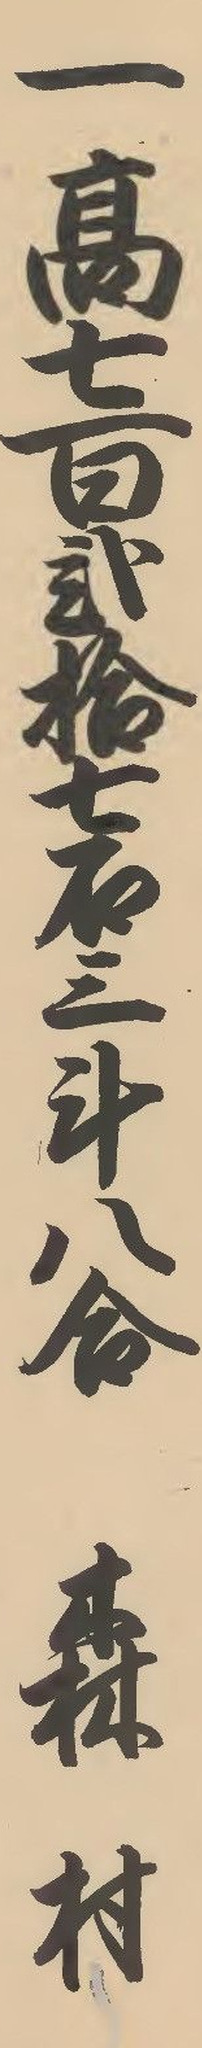一髙七百弐拾七石三斗八合森村
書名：上野国郷帳
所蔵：国立公文書館 National Archives of Japan
